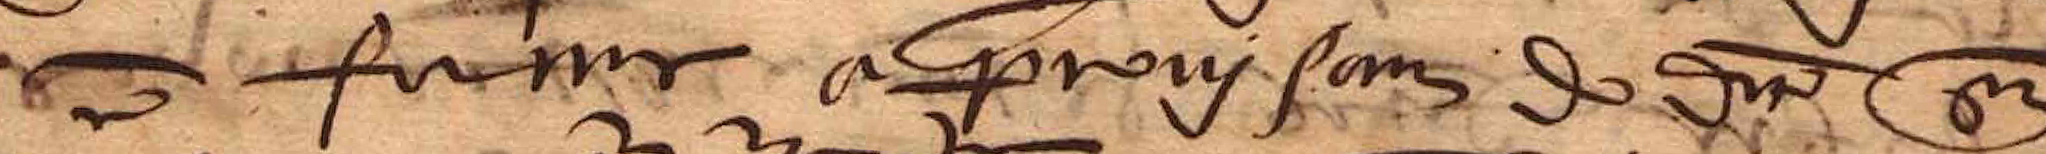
c̄oforme a proujsam do dito s̄or
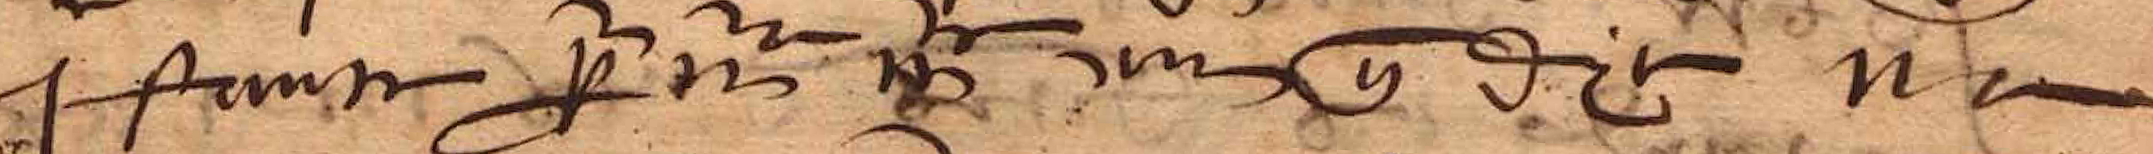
Jfante ꝑ̄mramte em q̄ dya na
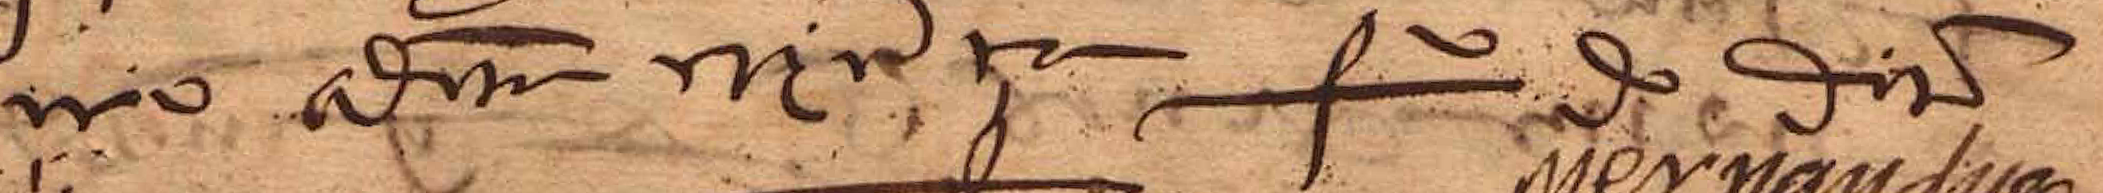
çeo a dita cryāça fo do dito
